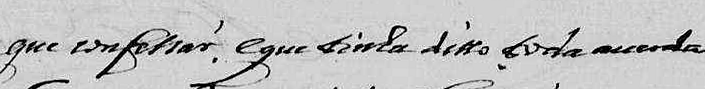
que confessar, e que tinha ditto toda a uerda
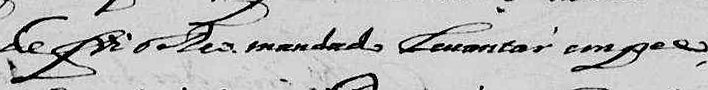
de foi o Reo mandado Leuantar em pee,
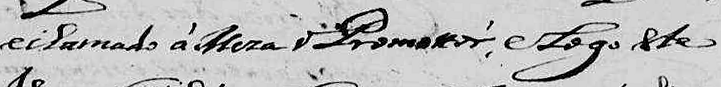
e chamado à Meza o Promottor, e Logo este
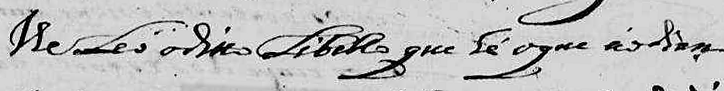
lhe Leo o ditto Libello que hé o que ao dian
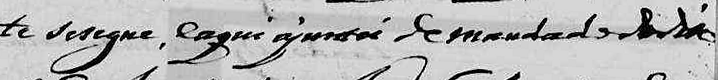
te se segue, e aqui ajuntei de mandado do dito
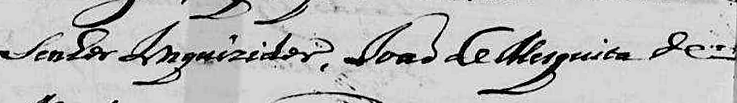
Senhor Inquizidor, Ioaõ de Mesquita de
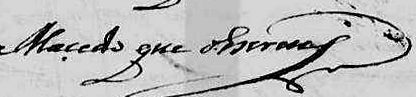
Macedo que o Escreuj
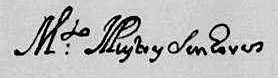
M:to Illustres Senhores
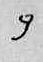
9
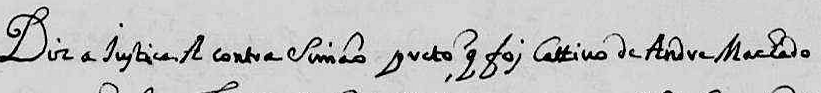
Diz a Iustica A contra Simaõ preto, q̄ foj Cattiuo de Andre Machado
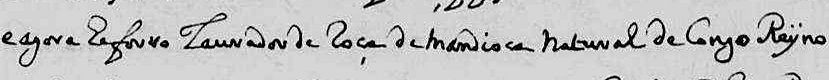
e agora he forro Laurador de Roça de mandioca natural de Congo Reyno
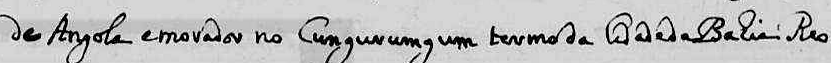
de Angola e morador no Cungurumgum termo da Cidade da Bahia Reo
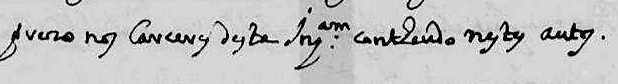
prezo nos Carceres desta Inq:am contheudo nestes autos.
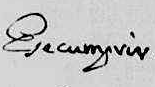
E se cumprir.
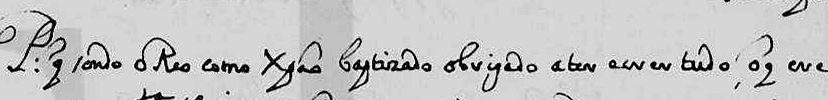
P: q̄ sendo o Reo como xpaõ baptizado obrigado a ter e crer tudo, o q̄ cre
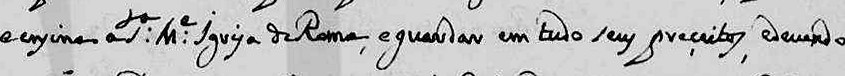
e ensina a sta: M:e Igreja de Roma, e guardar em tudo seus preceitos, e deuendo
